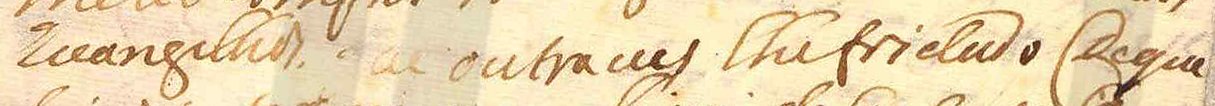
Euangelhos. que outra ues lhe foi dado De que
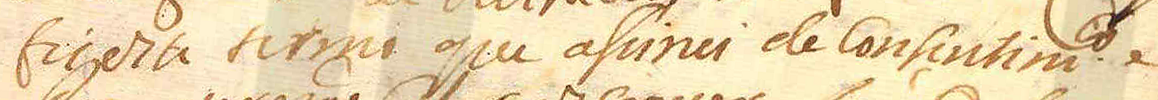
fis este termo que assinei de Consentim.to e
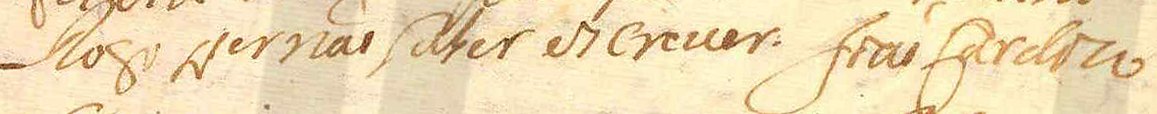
Rogo per não saber escreuer. Joaõ Cardozo
